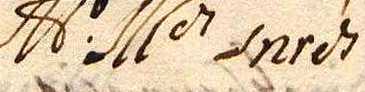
Mt.o Ill.es snres̄
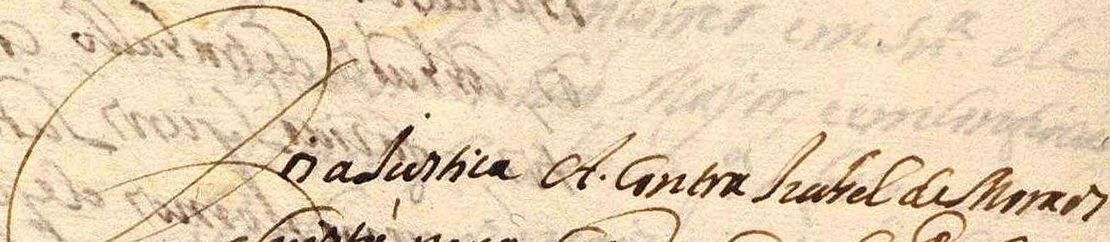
Dis a Iustiça A. contra Izabel de Moraes
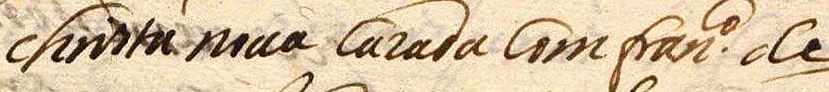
christā noua cazada com fran.co de
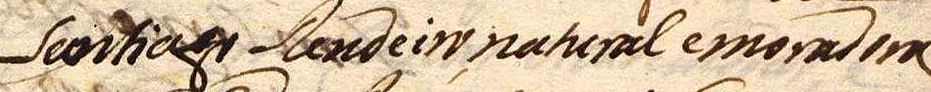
Santiago Rendeiro, natural e moradora
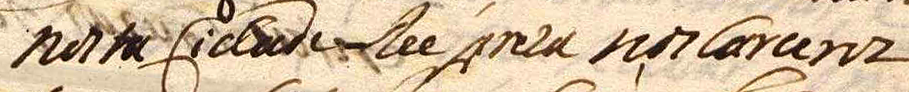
nesta Cidade Reé preza nos Carcerez
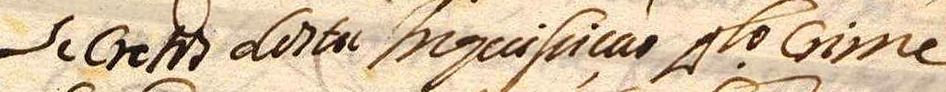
secretos desta Inquissição p.lo crime
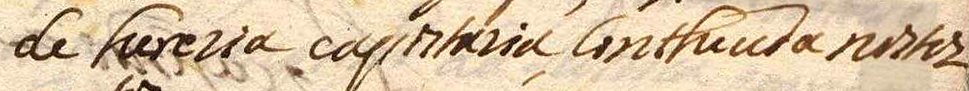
de herezia e apostazia, contheuda nestes
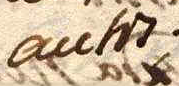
autos;
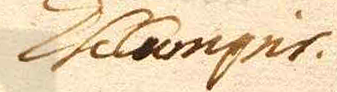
E se Cumprir.
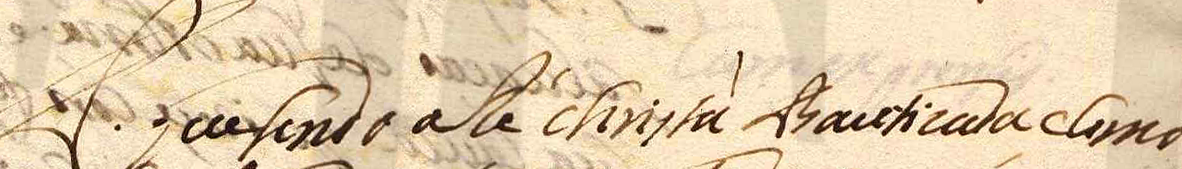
P. que sendo a Ré christā Bautizada e Como
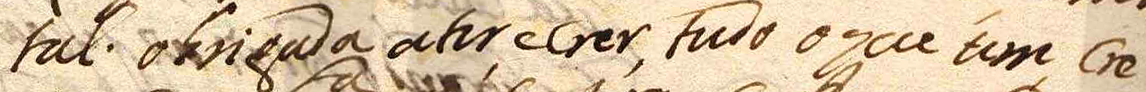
tal obrigada a ter e crer, tudo o que tem cré
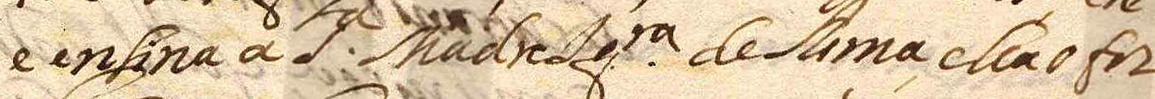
e ensina a s.ta Madre Ig.ra de Roma, ella o fez
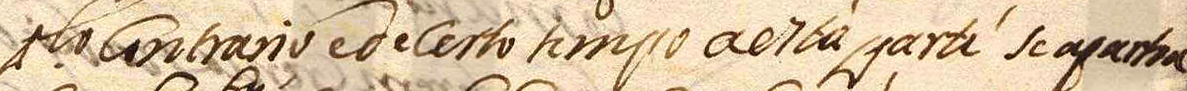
p.lo Contrario, e de certo tempo a esta parte se apartou
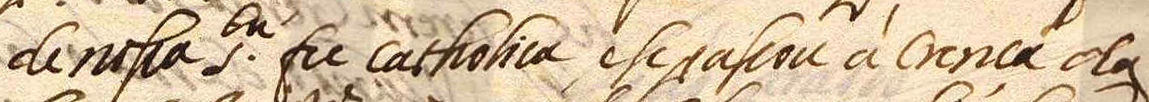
de nossa sta fee catholica, e se passou a crença da
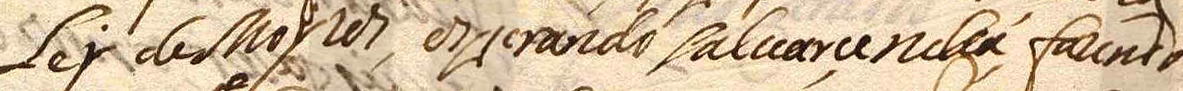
Ley de Moyzes, esperando saluarce nella, fazendo
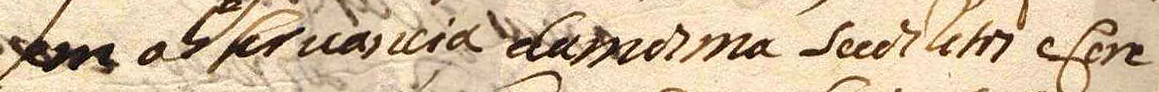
em obseruancia da mesma seus Ritos, e Cere
